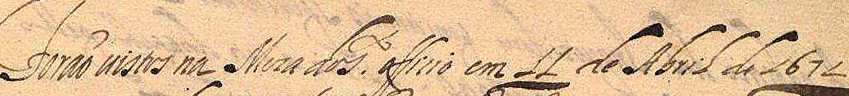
Foraõ uistos na Meza do s.to officio em 11 de Abril de 1671
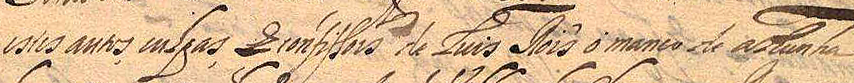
estes autos, culpas E confissoĩs de Luis Rois̄ o manco de alcunha
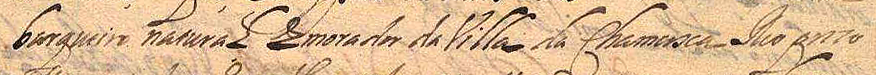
barqueiro natural E morador da Villa da Chamusca Reo prezo
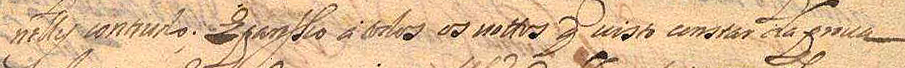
nelles conteudo; E paresseo a todos os uottos q̄ uisto constar da proua
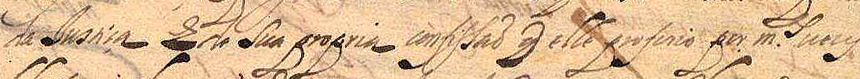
da Iustiça E de sua propria confissaõ q̄ elle proferio por m.as uezes
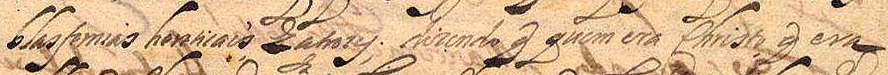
blasfemias hereticaes, E atrozes; dizendo q̄ quem era Christo, q̄ era
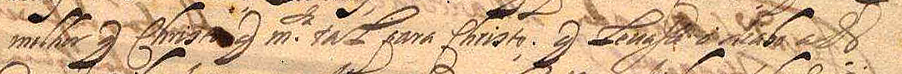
melhor q̄ Christo q̄ m.ta tal para Christo; q̄ Leuasse o diabo a Ds̄
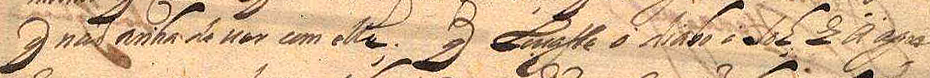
q̄ naõ tinha de uer com ella; q̄ Leuasse o diabo o sol, E a agoa
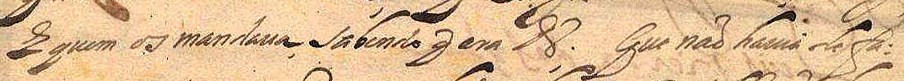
E quem os mandaua, sabendo q̄ era Ds̄; Que naõ hauia de fa
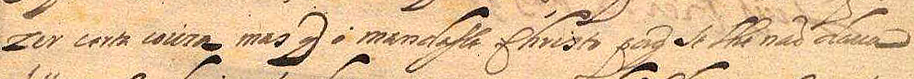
zer certa couza mas q̄ o mandasse Christo porq̄ se lhe naõ daua
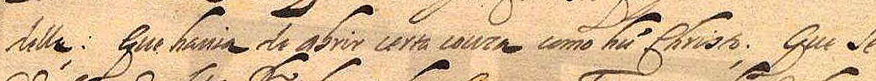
delle; que hauia de abrir certa couza como hū Christo; que se
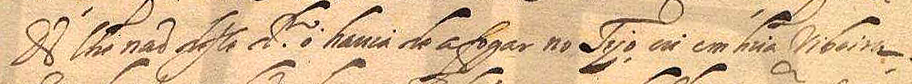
Ds̄ lhe naõ desse d.ro o hauia de afogar no Tejo, ou em hua ribeira;
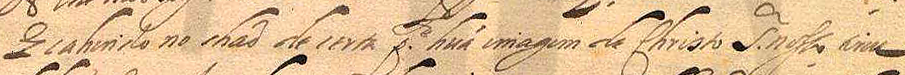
E cahindo no chaõ de certa p.te huā imagem de Christo S.or nosso, tirou
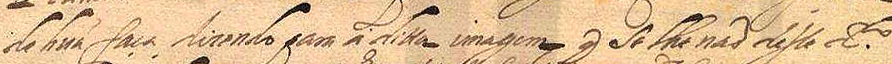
de huā faca, dizendo para a ditta imagem q̄ se lhe não desse d.ro
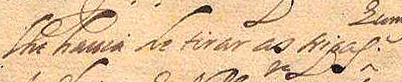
lhe hauia de tirar as tripas.
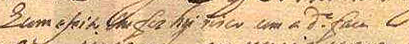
E com efeito lhe fez hū risco com a d̄.a faca
